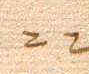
22
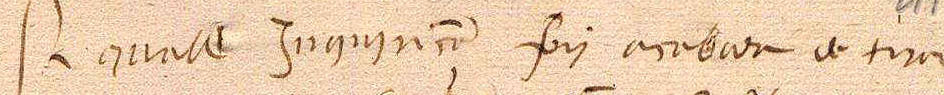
a quall Jnqujriçā foy acabada de tirar
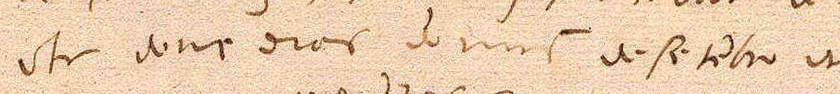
oJe dous dias do mes de setēbro de
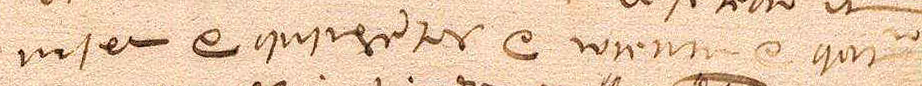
mjll e qujnhētos e corenta e qatro
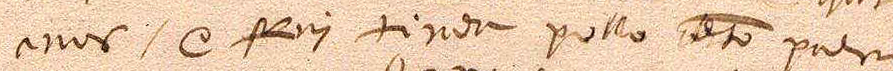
anos / e foy tirada pollo d̄to padre
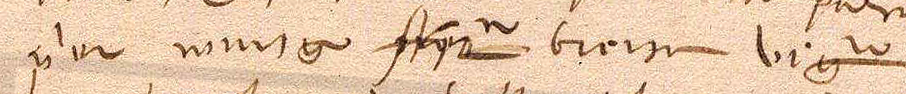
pior comigo ffrrco vieira vigro
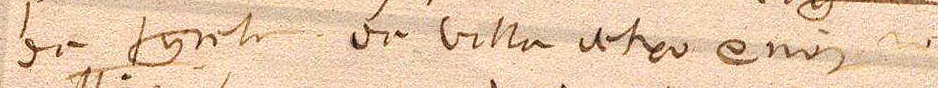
da JgreIa da villa deIxo e notro
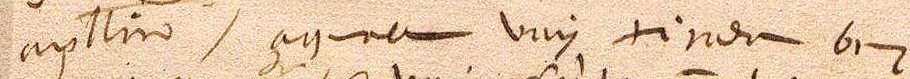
apllico / a quall vay tirada bem
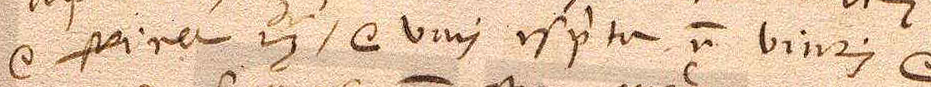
e fiellmte / e vay espita ē vinte e
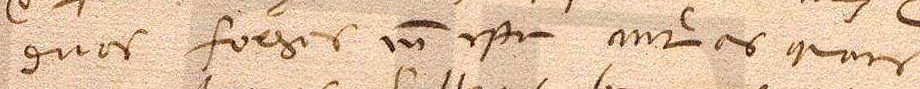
duas folhas cō esta ant̄ as quaes
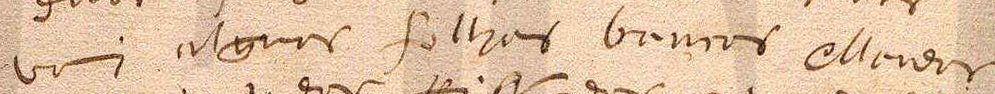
vam alguas folhas bancas e laudas
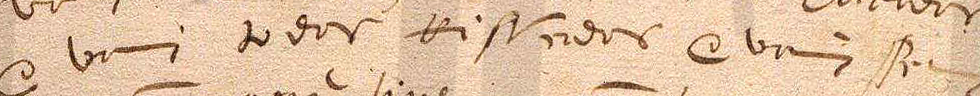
e vam todas Riscadas e vam sem
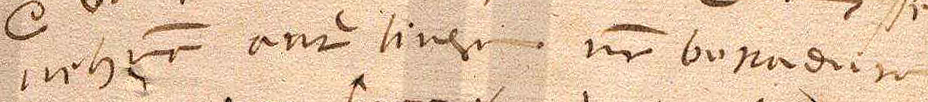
nehuā ant̄linha nē borradura
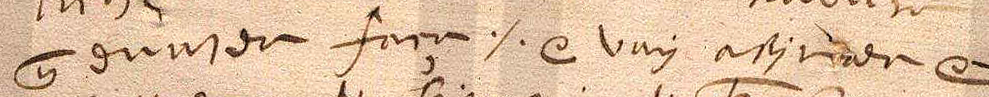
q̄ duuida faça ./. e vay asynada e
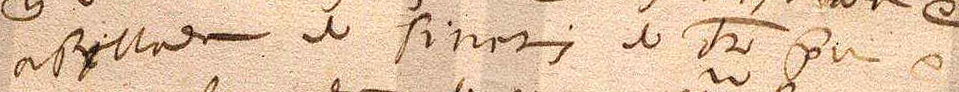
asellada do sinete do d̄to p̄or e
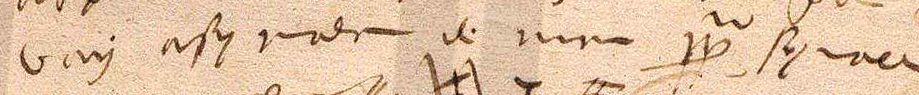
vay asynada de meu ꝓpco synall
